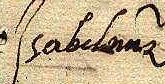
Jsabel nuz̄
